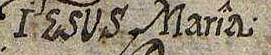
IESUS Maria
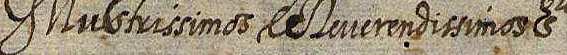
Illustrissimos e Reuerendissimos sorēs
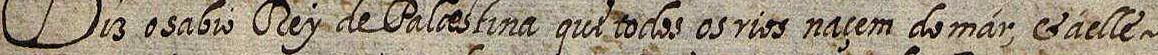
Diz o sabio Rey de Palestina que todos os rios naçem do mar, & a elle
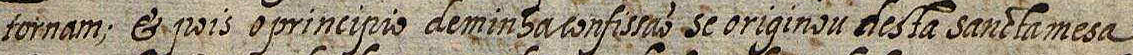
tornam; & pois o principio de minha confissão se originou desta sancta mesa
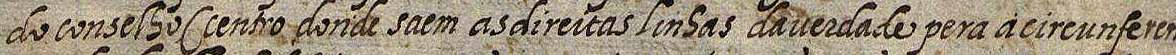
do conselho (centro donde saem as direitas linhas da uerdade pera a circunferen
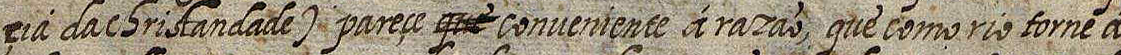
çia da christandade) pareçe que conueniente á razaõ, que como rio forne á
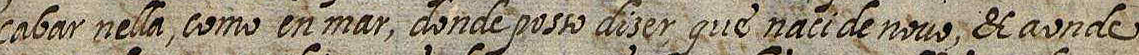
cabar nella, como en mar, donde posso dizer que naci de nouo & aonde
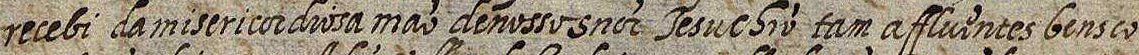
recebi da misericordiosa maõ de nosso snor̄ Iesu chrō tam affluentes bens co
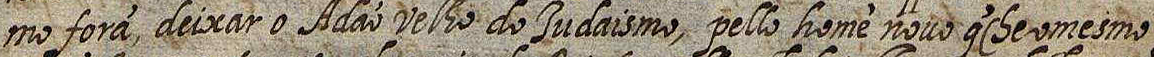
mo forā, deixar o Adaõ velho do Judaismo, pelo homē nouo q̄ (he o mesmo
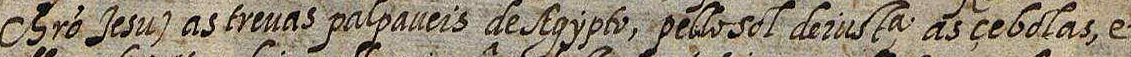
Chrō Jesu) as treuas palpaueis de Ægypto pello sol de iusta, as çebolas, e
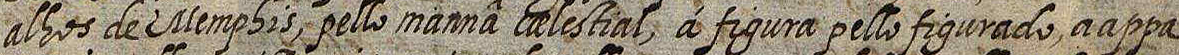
alhos de Memphis, pello mannâ cælestial, á figura pello figurado, a appa
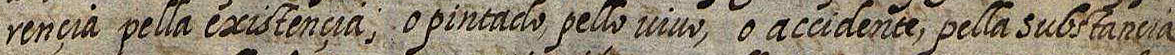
rençia pella existençia, o pintado pello uiuo, o accidente, pella substancia
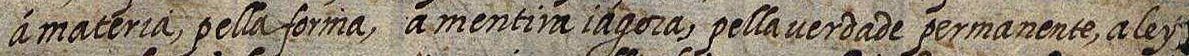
á materia, pella forma, a mentira iágora, pella uerdade permanente, a ley
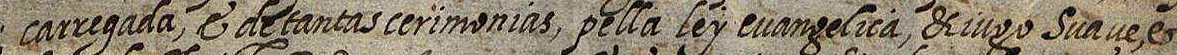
carregada, E de tantas cerimonias, pella ley euangelica, & iugo Suaue, &
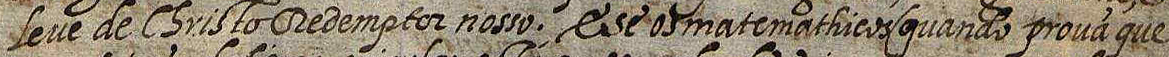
Leue de Christo Redemptor nosso. & se os matemathicos (quando naõ prouā que
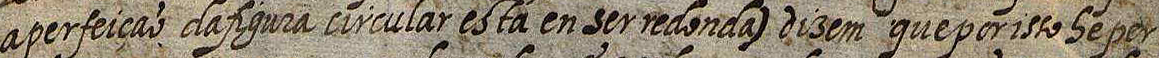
a perfeiçaõ da figura circular está en ser redonda) dizem que por isso he per
